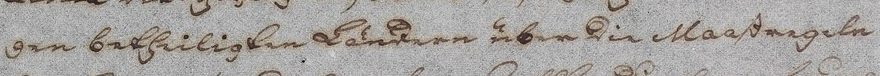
gen betheiligten Ländern über die Maaßregeln
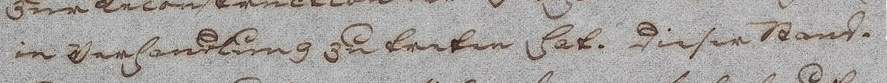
in Verhandlung zu treten hat. Dieser Stand-
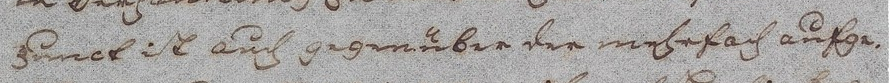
punct ist auch gegenüber der mehrfach aufge-
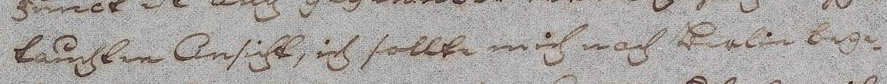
tauchten Ansicht, ich solle mich nach Berlin bege-
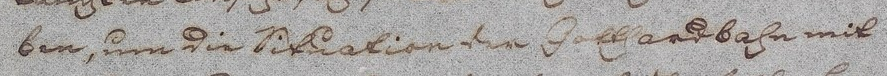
ben, um die Situation der Gotthardbahn mit
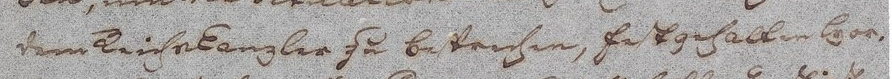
dem Reichskanzler zu besprechen, festgehalten wor-
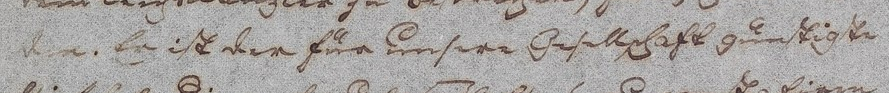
den. Er ist der für unsere Gesellschaft günstigste
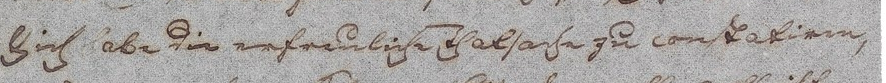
& ich habe die erfreuliche Thatsache zu constatiren,
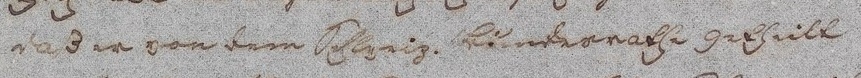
daß er von dem Schweiz. Bundesrathe getheilt
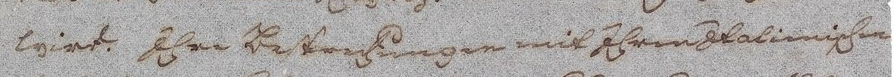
wird. Ihre Besprechungen mit Ihren Italienischen
